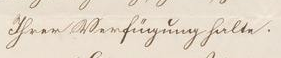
Ihrer Verfügung halte.
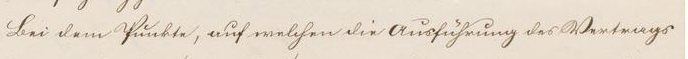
Bei dem Punkte, auf welchen die Ausführung des Vertrags
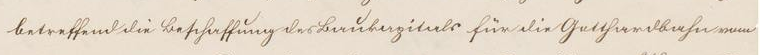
betreffend die Beschaffung des Baukapitals für die Gotthardbahn vom
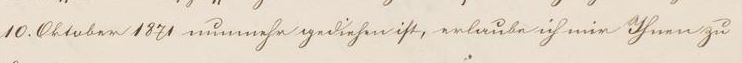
10. Oktober 1871 nunmehr gediehen ist, erlaube ich mir Ihnen zu
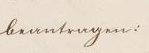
beantragen:
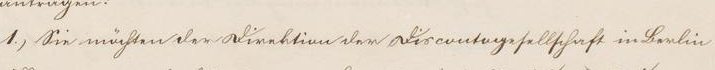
1.) Sie möchten der Direktion der Discontogesellschaft in Berlin
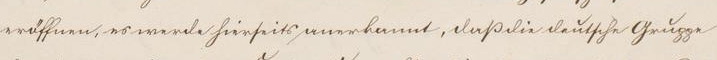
eröffnen, es werde hierseits anerkannt, daß die deutsche Gruppe
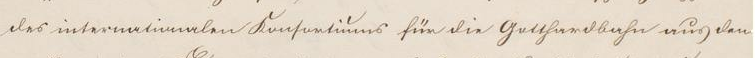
des internationalen Konsortiums für die Gotthardbahn aus den
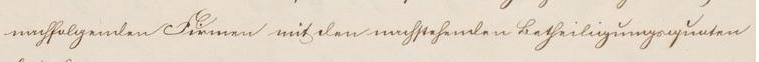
nachfolgenden Firmen mit den nachstehenden Betheiligungsquoten
